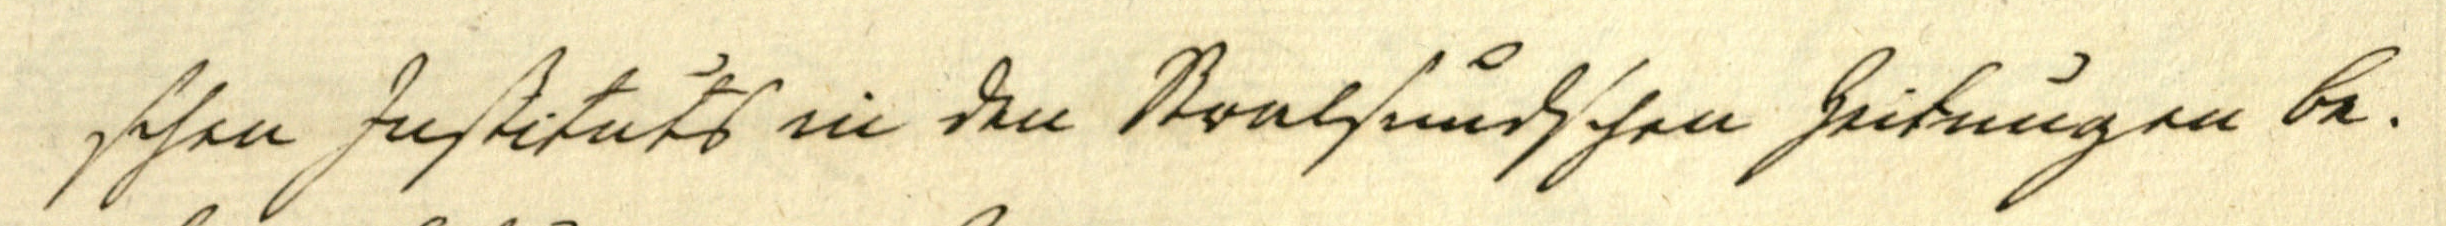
schen Instituts in den Stralsundschen Zeitungen be¬
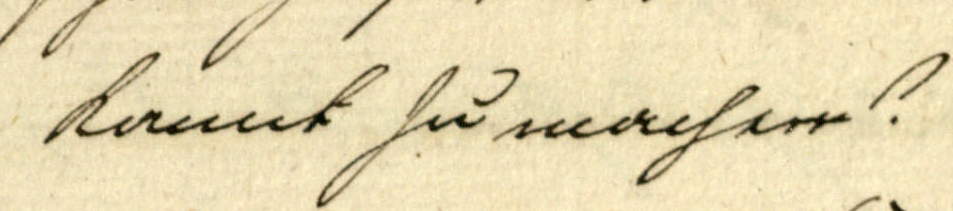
kannt zu machen?
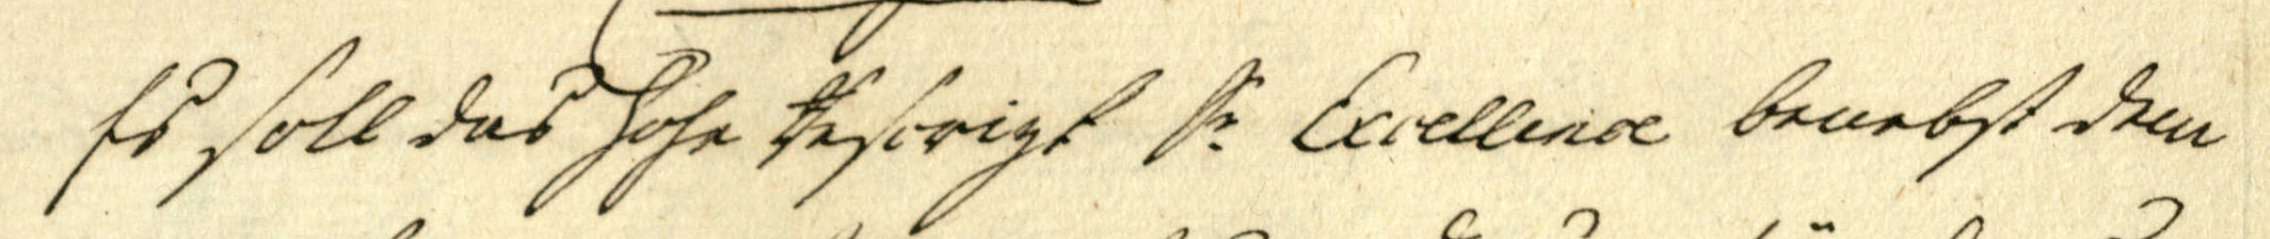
Es soll das hohe Rescript Sr. Excellence benebst dem
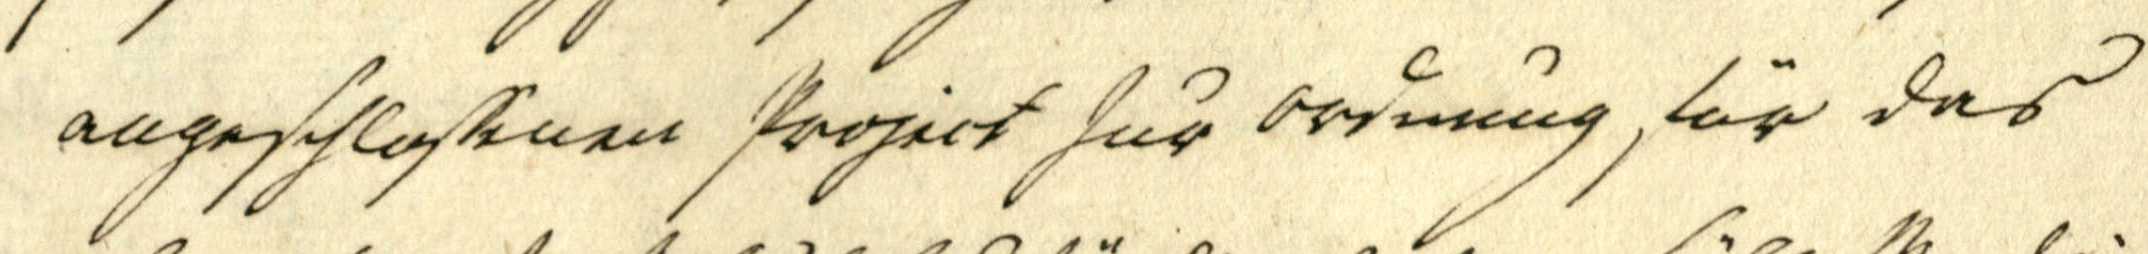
angeschlossenen Project zur Ordnung für das
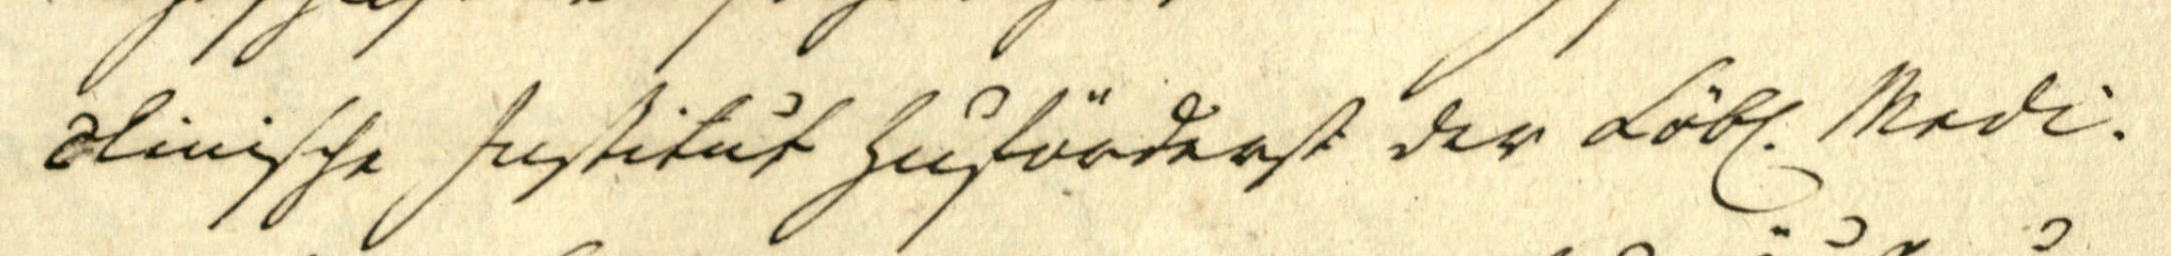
clinische Institut zuförderst der Löbl. Medi¬
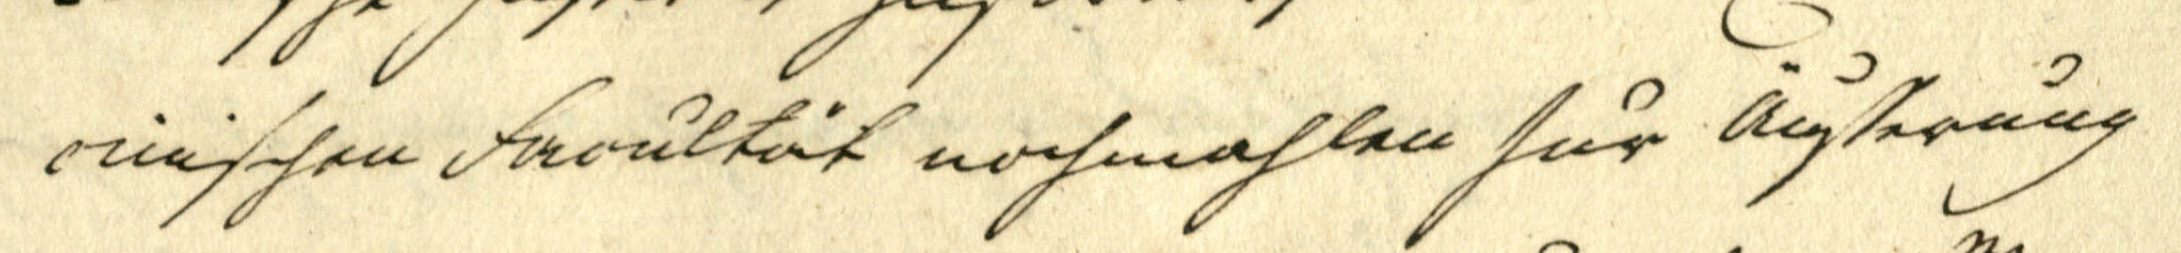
cinischen Facultät nochmahlen zur Äusserung
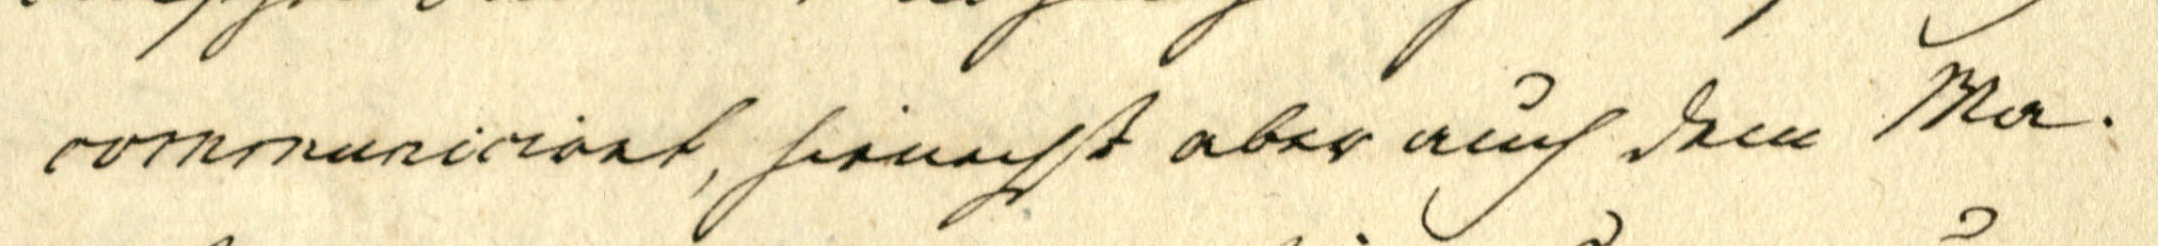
communiciret, hienechst aber auch dem Ma¬
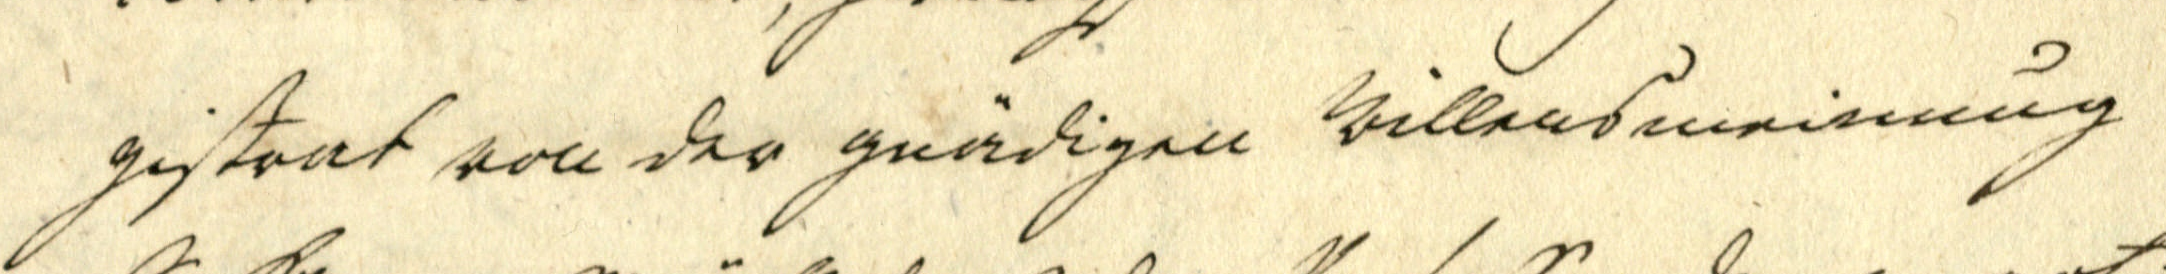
gistrat von der gnädigen Willensmeinung
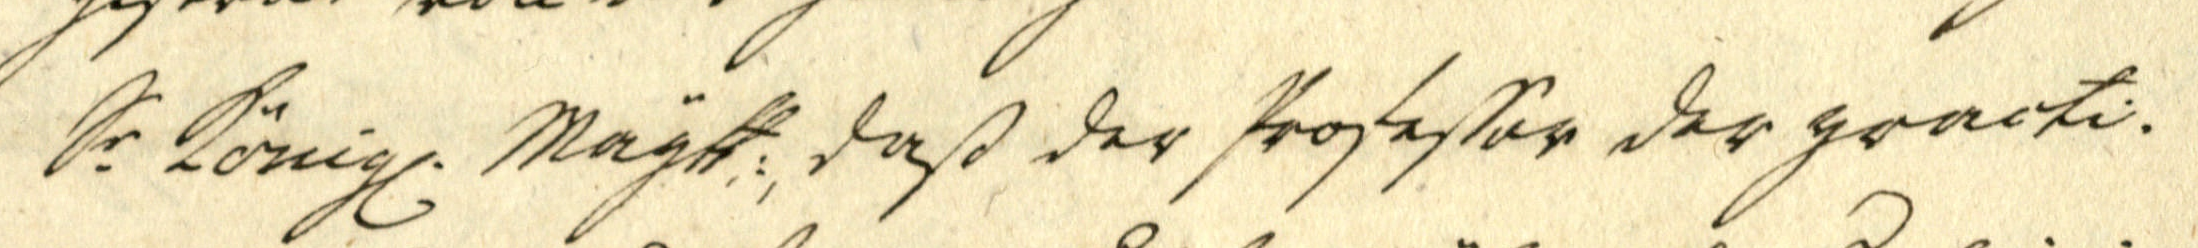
Sr. Königl. Maÿtt., daß der Professor der practi¬
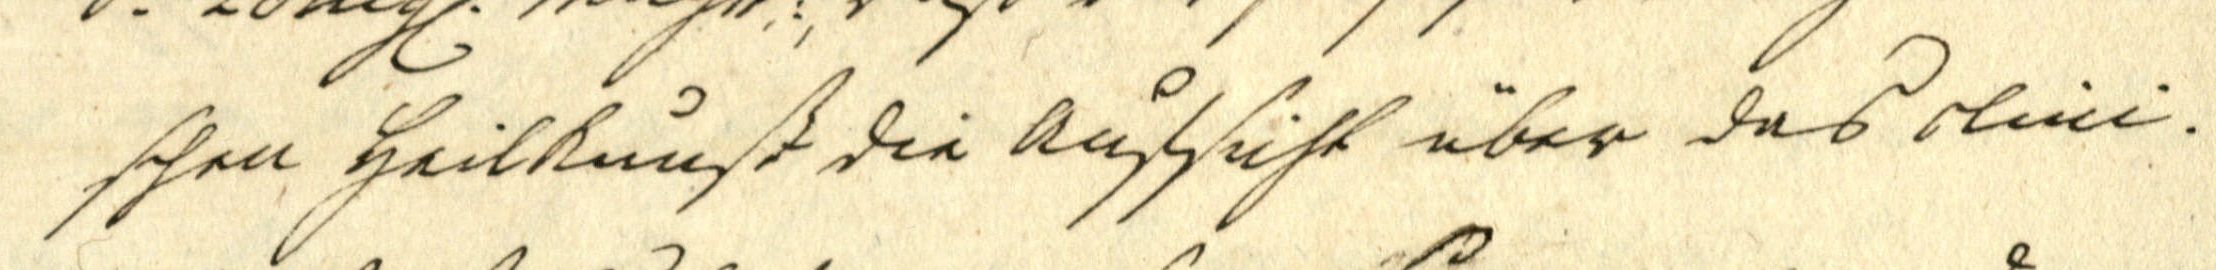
schen Heilkunst die Aufsicht über das clini¬
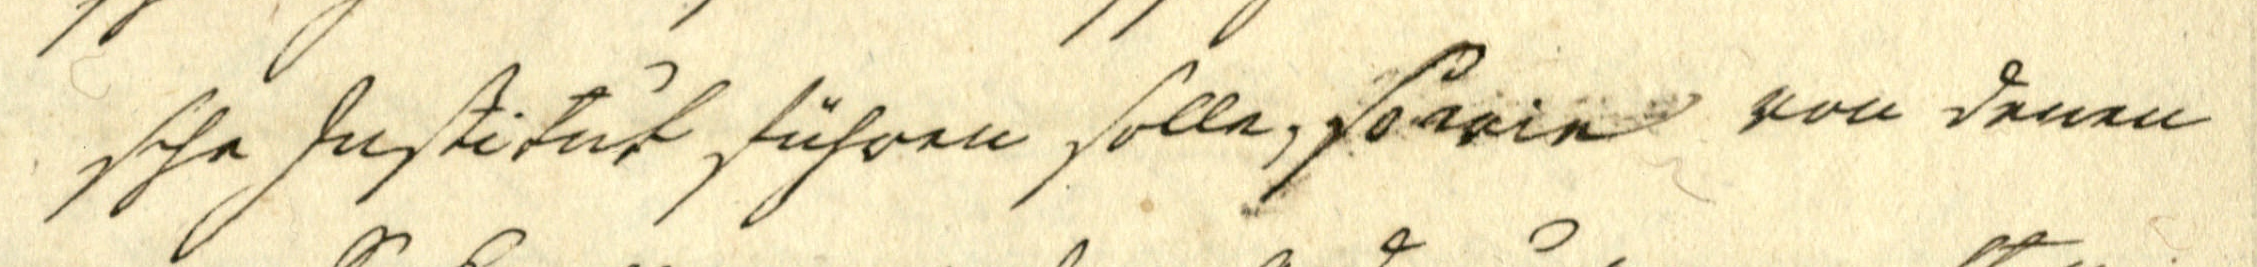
sche Institut führen solle, sowie von denen
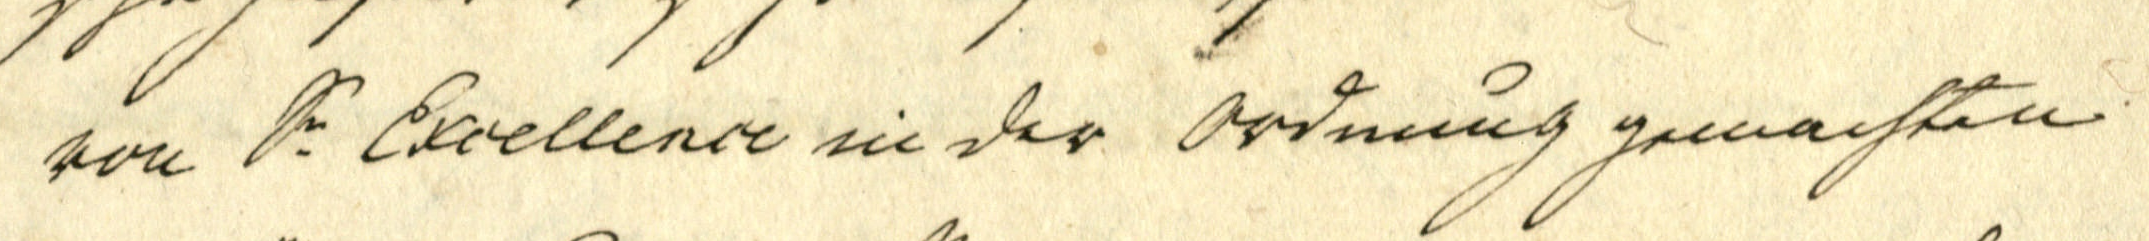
von Sr. Excellence in der Ordnung gemachten
